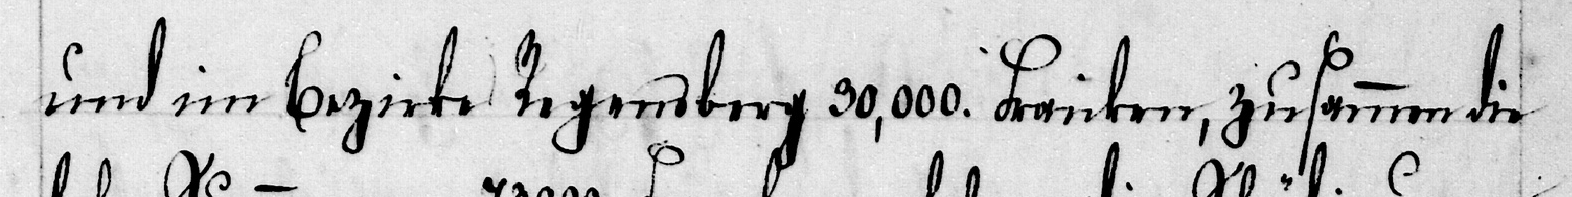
und im Bezirke Regensberg 30'000. Franken, zusammen die
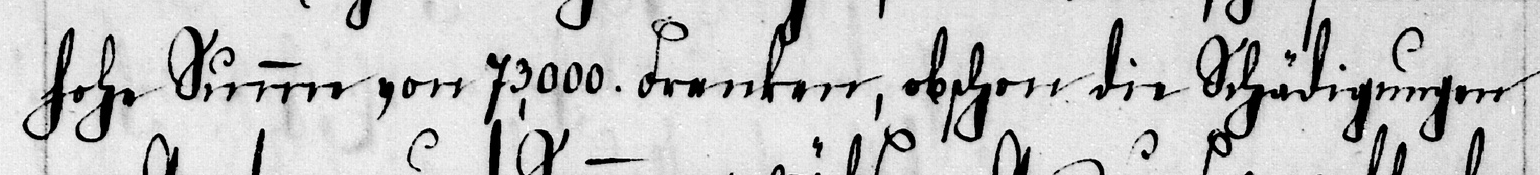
hohe Summe von 73'000. Franken, obschon die Schädigungen
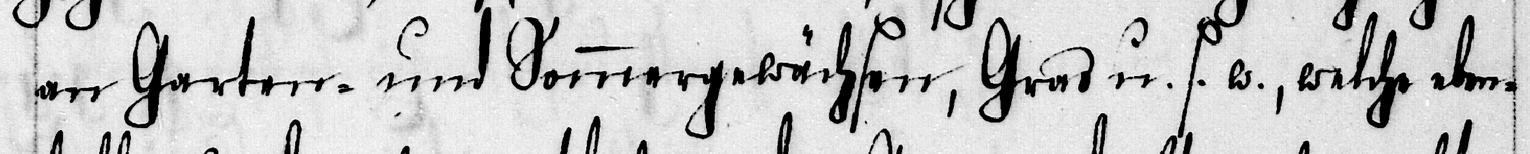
an Garten- und Sommergewächsen, Gras u. s. w., welche eben¬
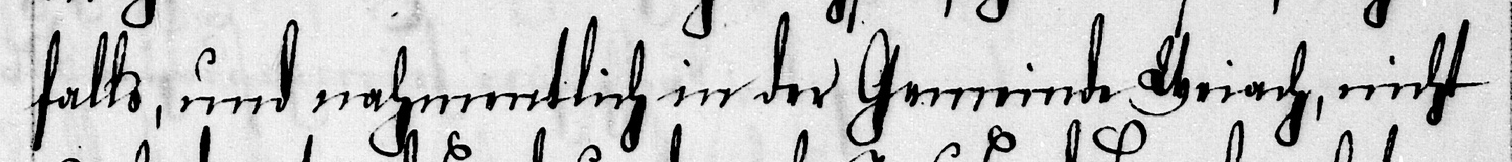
falls, und nahmentlich in der Gemeinde Weiach, nicht
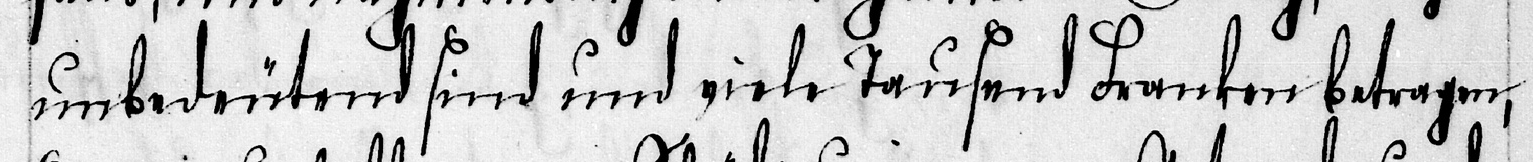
unbedeutend sind und viele Tausend Franken betragen,
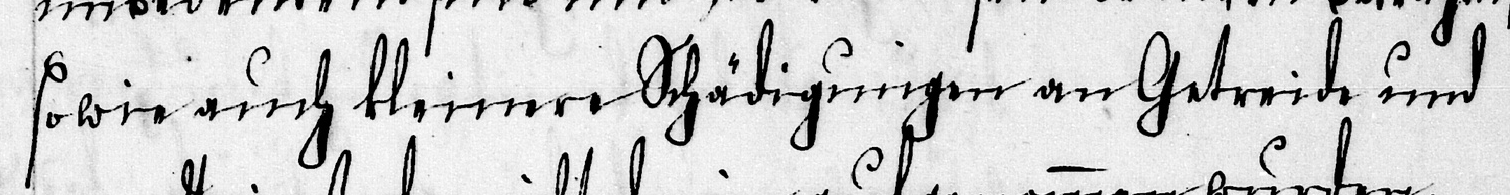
sowie auch kleinere Schädigungen an Getreide und
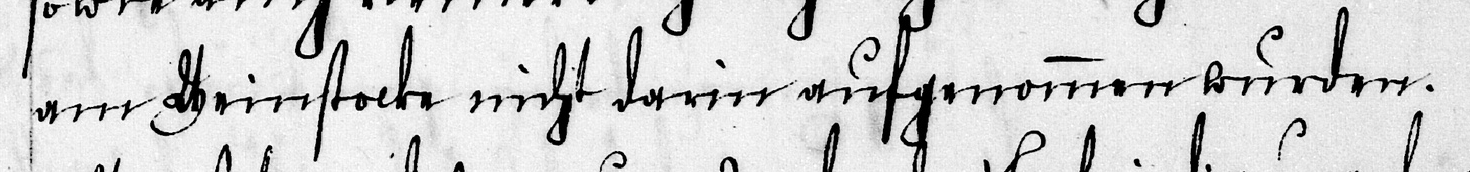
am Weinstocke nicht darin aufgenommen wurden.
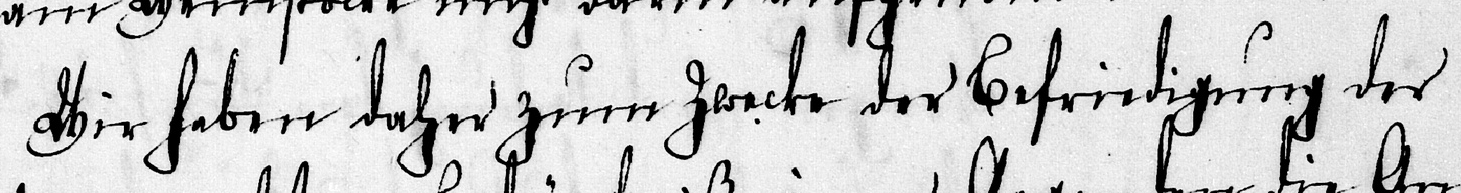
Wir haben daher zum Zwecke der Befriedigung der
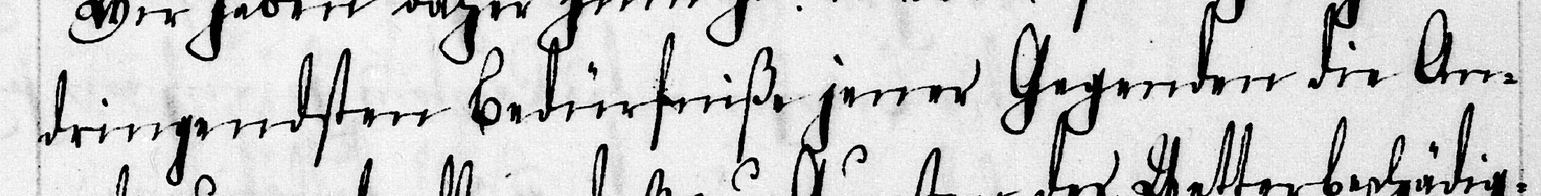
dringendsten Bedürfniße jener Gegenden die An¬
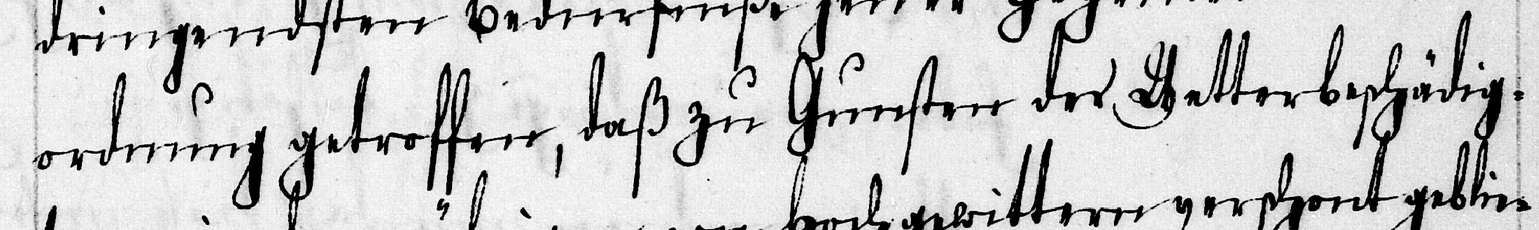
ordnung getroffen, daß zu Gunsten der Wetterbeschädig¬
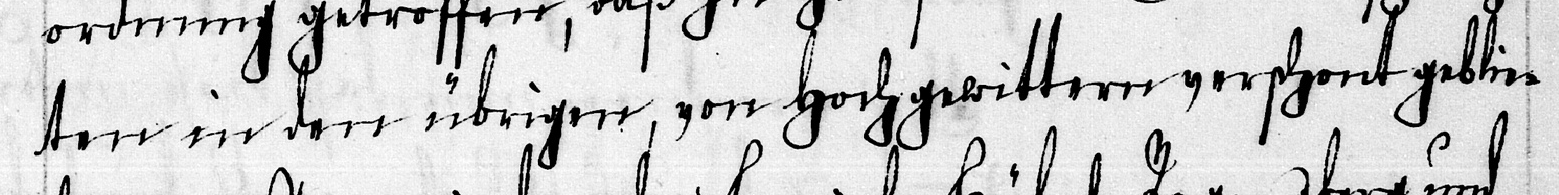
ten in den übrigen, von Hochgewittern verschont geblie¬
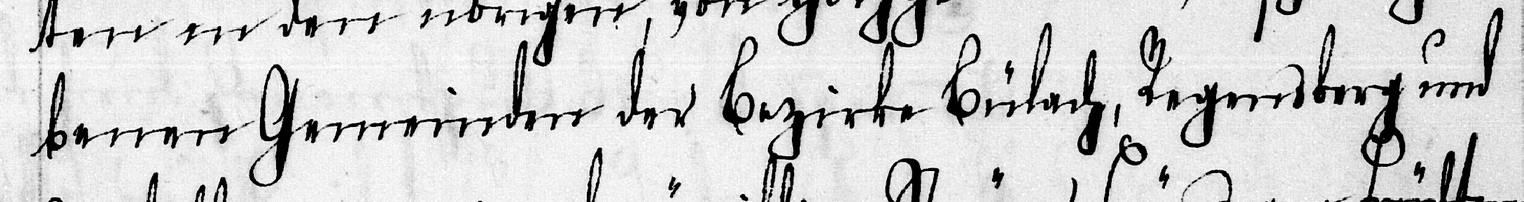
benen Gemeinden der Bezirke Bülach, Regensberg und
